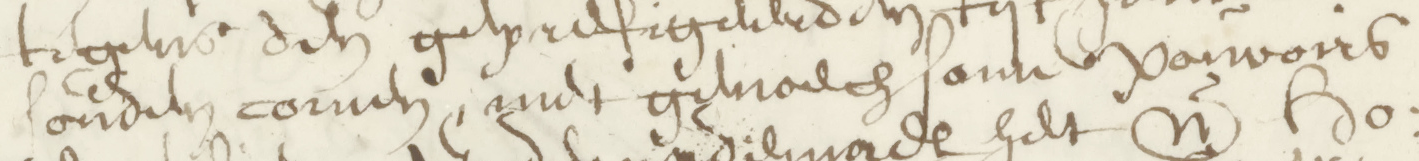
souden comen, met genoech sonne Pouvoirs
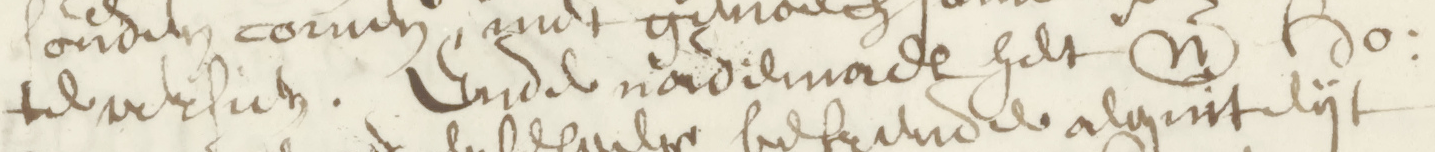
te versien. Ende nademael het U. Ho:
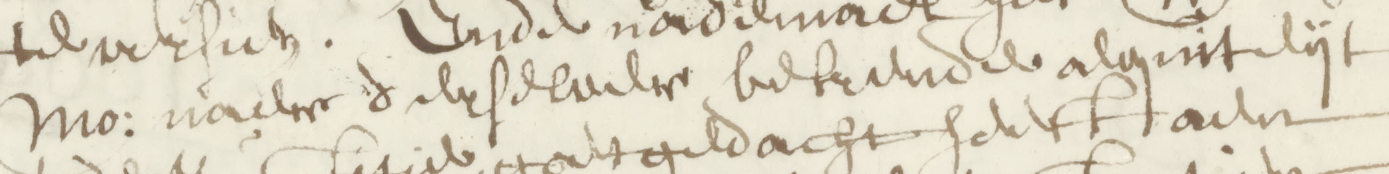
Mo: naer derselver bekende alnuiteijt
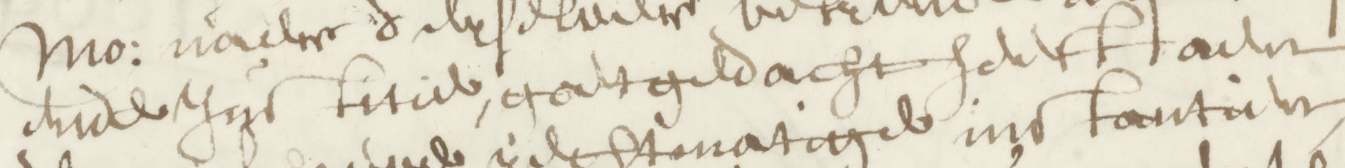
ende Justitie, goetgedacht heeft aen
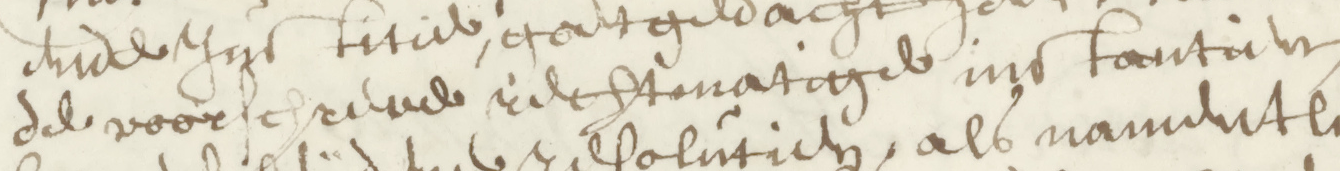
de voorschreve rechtmatige instantien
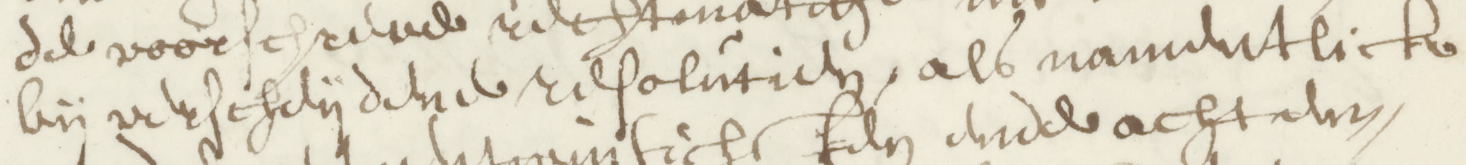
bij verscheijdene resolutien, als namentlick
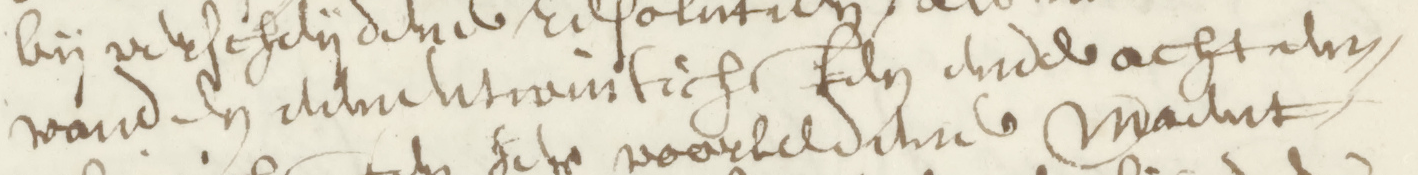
vanden eenentwintichsten ende achten„
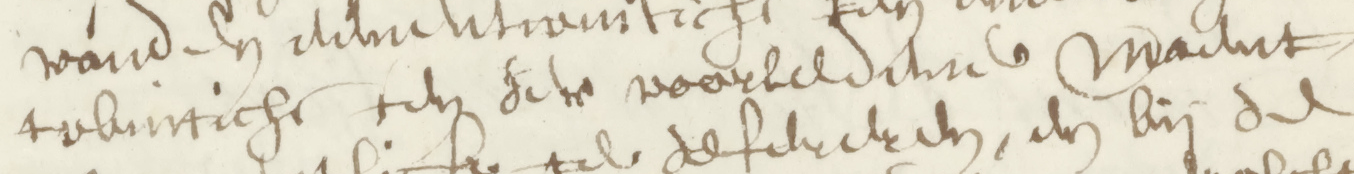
twintichsten der voorledene maent
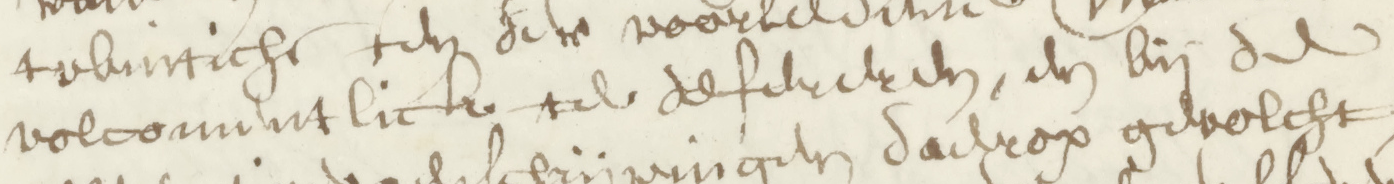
volcomentlick te defereren, en bij de
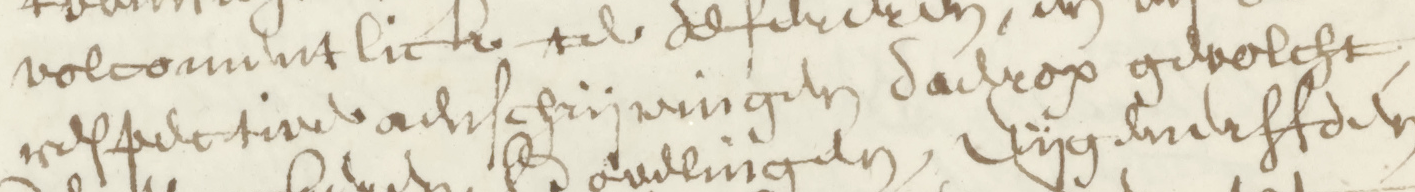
respective aenschrijvingen daerop gevolcht
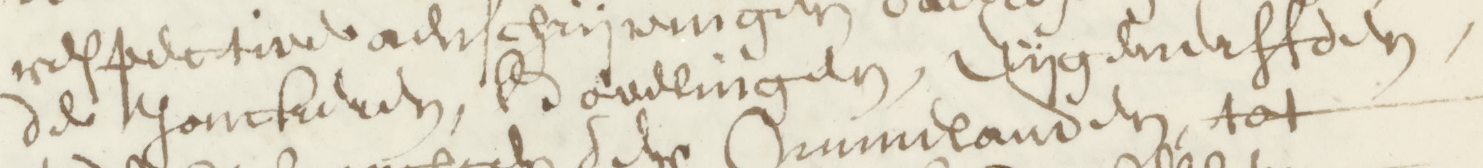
de Jonckeren, Hovelingen, Eijgenerffden,
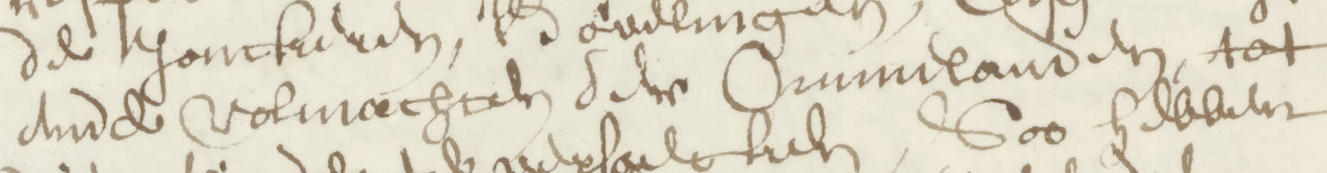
ende volmachten der Ommelanden tot
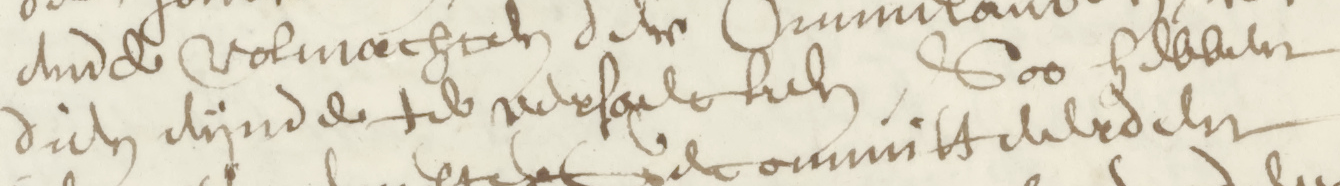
dien eijnde te versoecken, Soo hebben
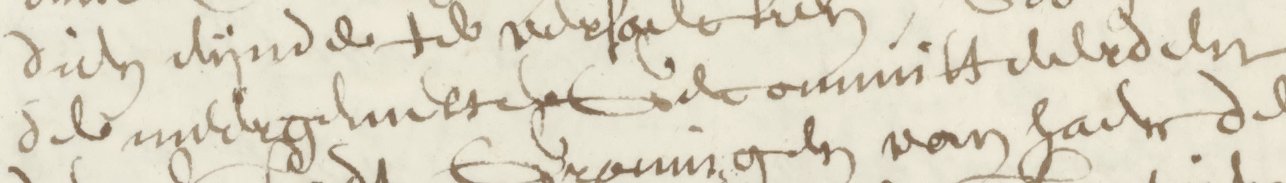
de meergemelte gecommitteerden
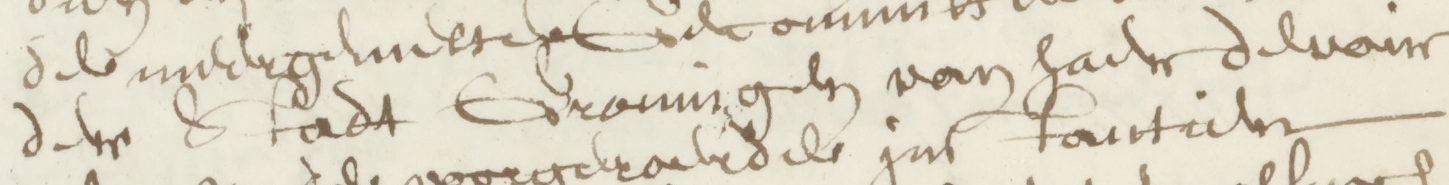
der Stadt Groningen van haer devoir
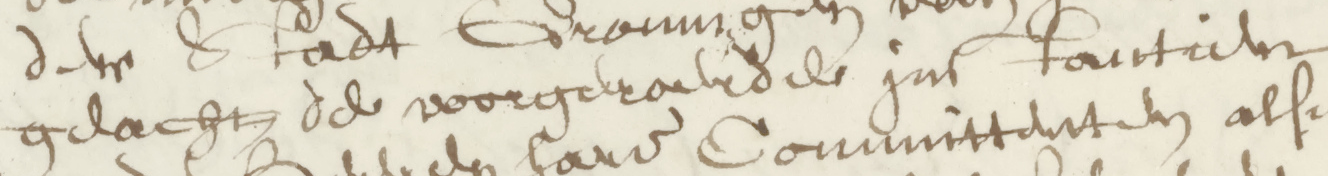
geacht, de voorgeroerde instantien
